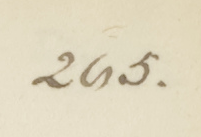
285.
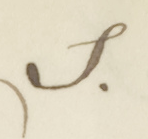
S.
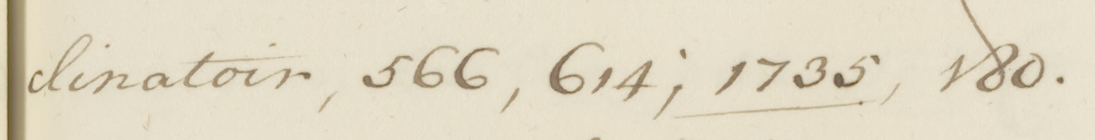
clinatoir, 566, 614; 1735, 180.
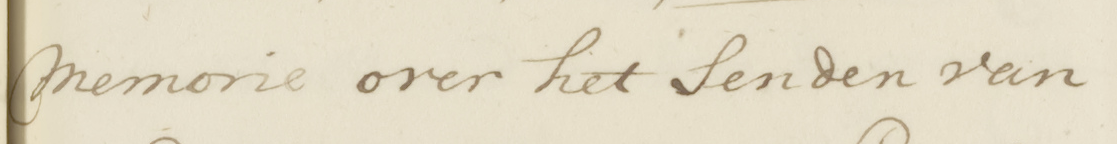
Memorie over het senden van
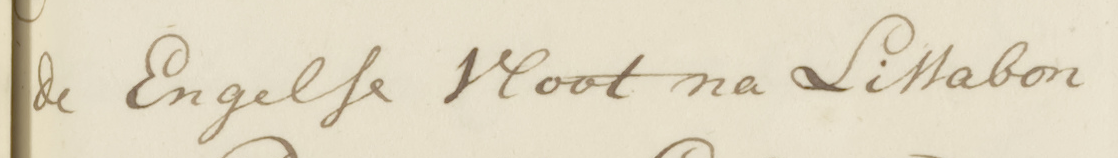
de Engelse Vloot na Lissabon
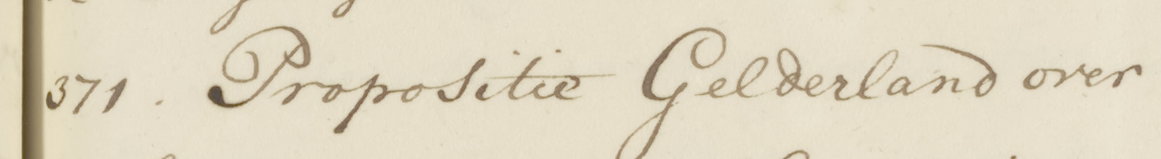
371. Propositie Gelderland over
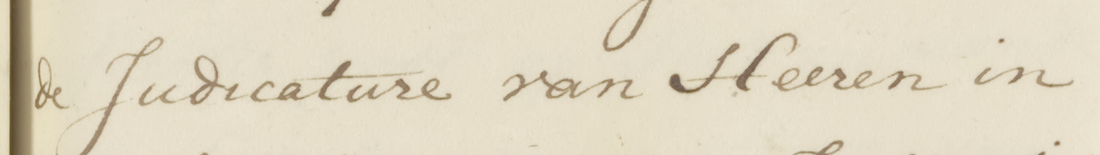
de Judicature van Heeren in
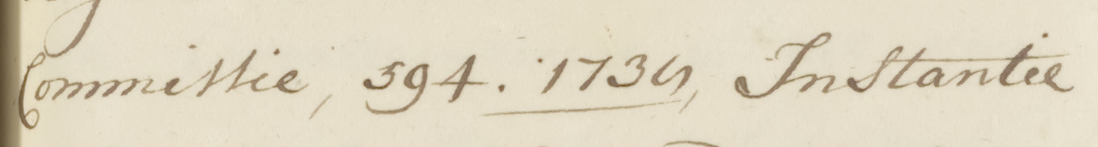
Commissie, 594. 1738, Instantie
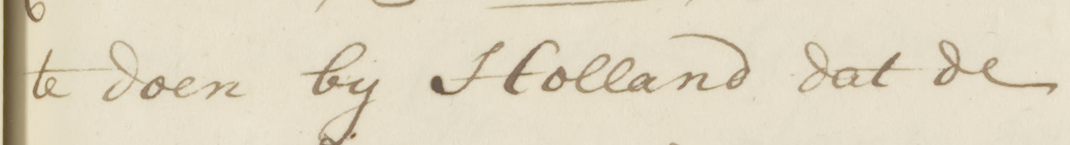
te doen bij Holland dat de
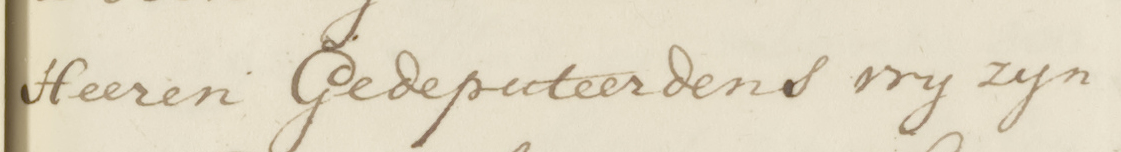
Heeren Gedeputeerdens vry zyn
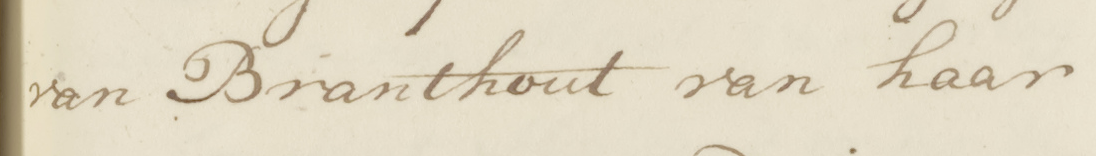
van Branthout van haar
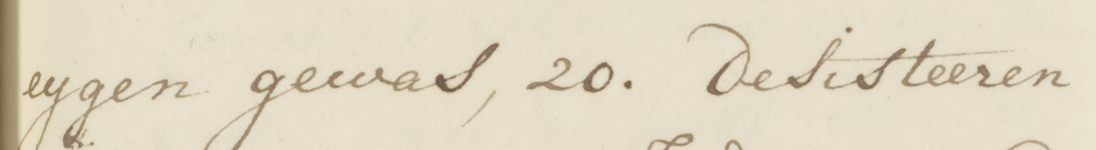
eygen gewas, 20. Desisteeren
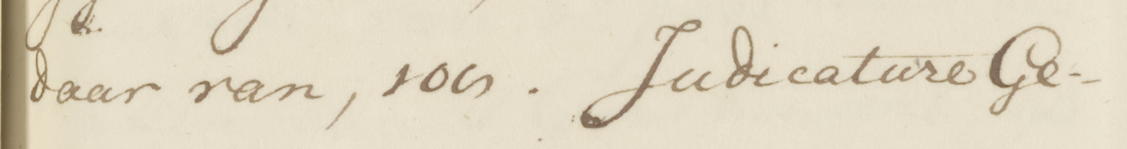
daar van, 108. Judicature Ge„
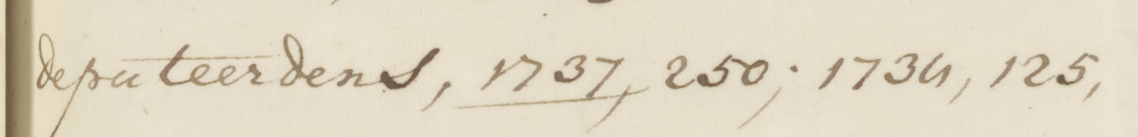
deputeerdens, 1737, 250; 1738, 125,
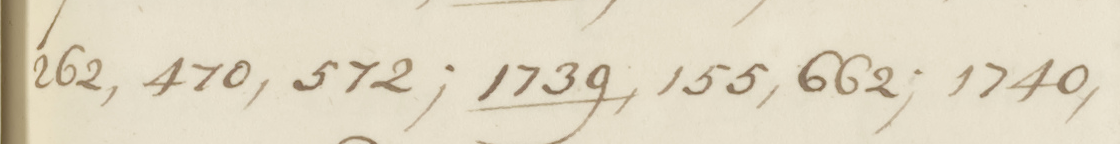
262, 470, 572; 1739, 155, 662; 1740,
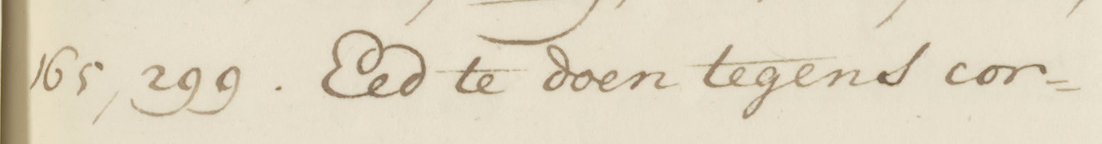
165, 299. Eed te doen tegens cor=
